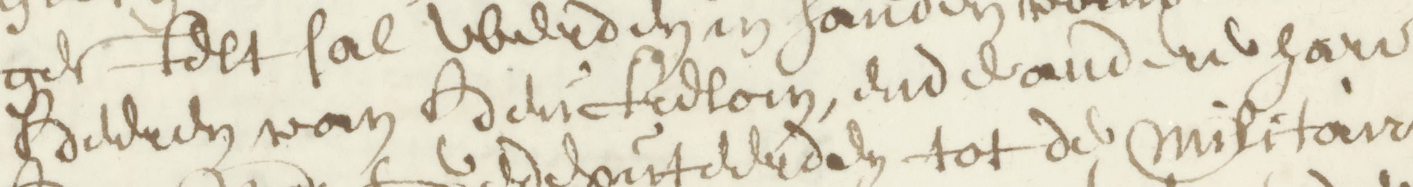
Heeren van Heuckelom, ende andere hare
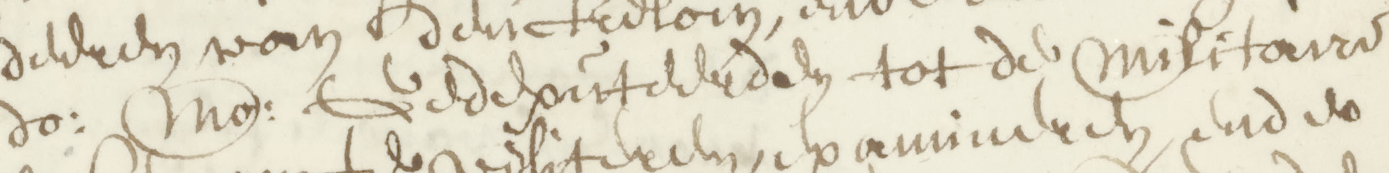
Ho:Mo: Gedeputeerden tot de militaire
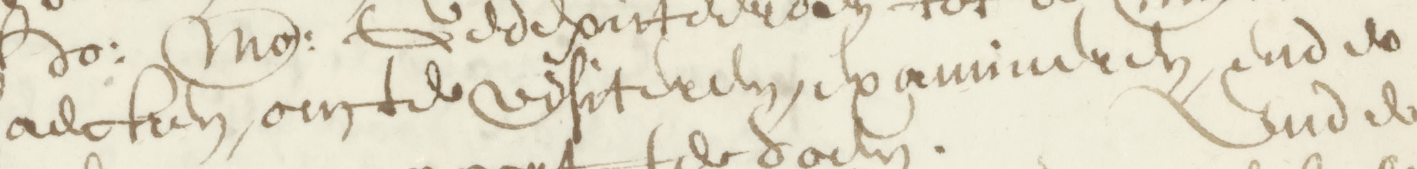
saecken, om te visiteren, examineren, ende
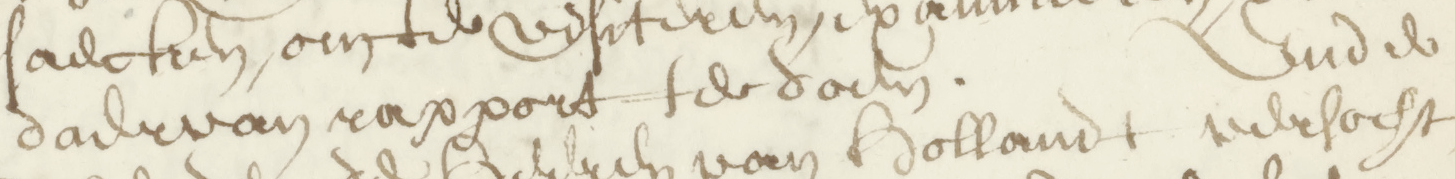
daervan rapport te doen. Ende
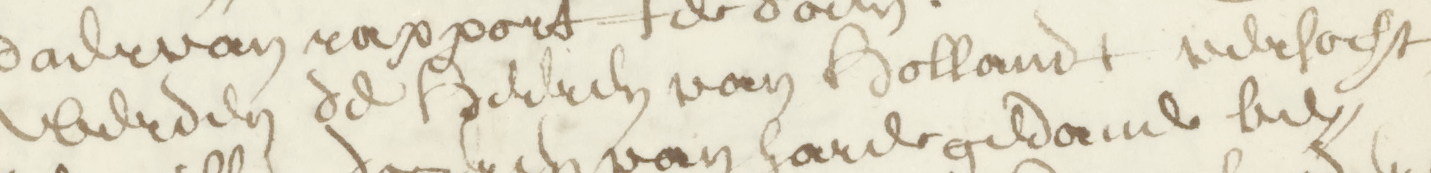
werden de Heeren van Hollandt versocht,
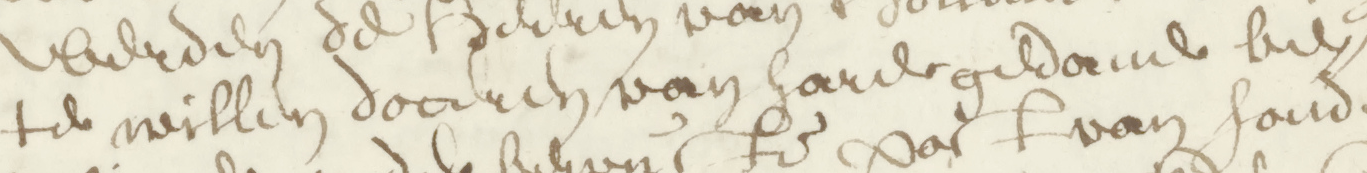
te willen doceren van hare gedane be„
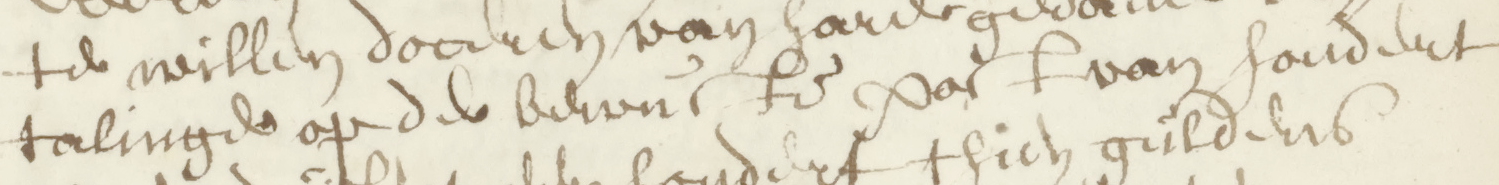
talinge op de bewuste post van hondert
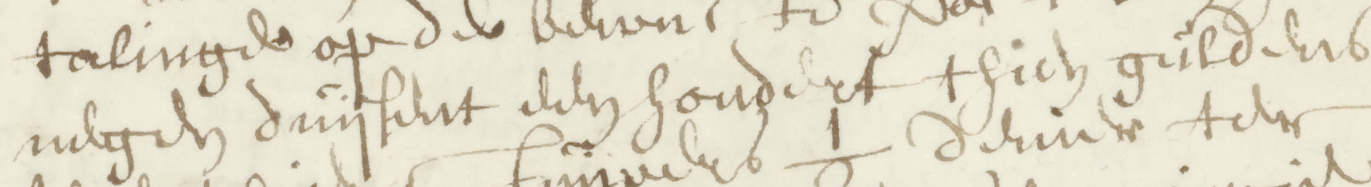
negen duijsent een hondert thien guldens
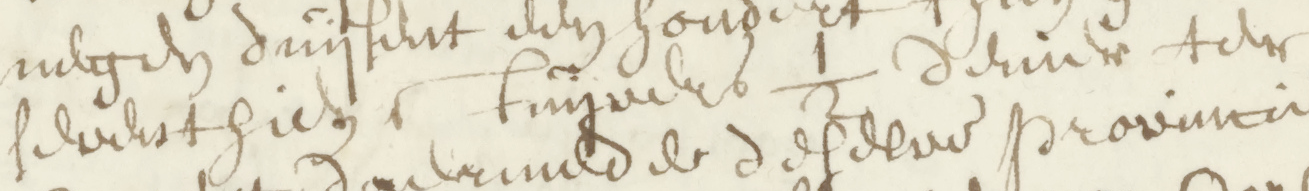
seventhien stuijvers ½ denier ter
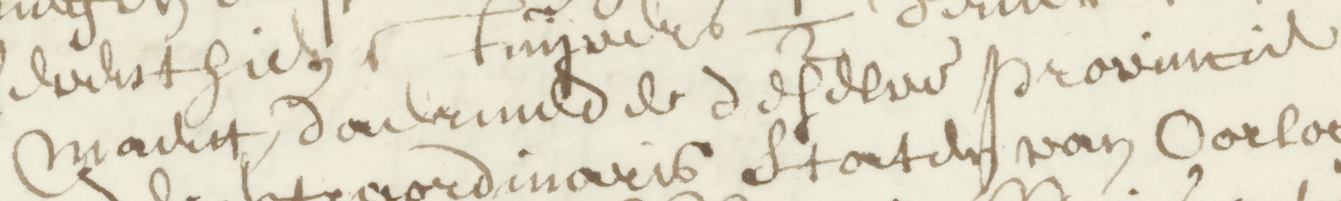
maent, daermede deselve provincie
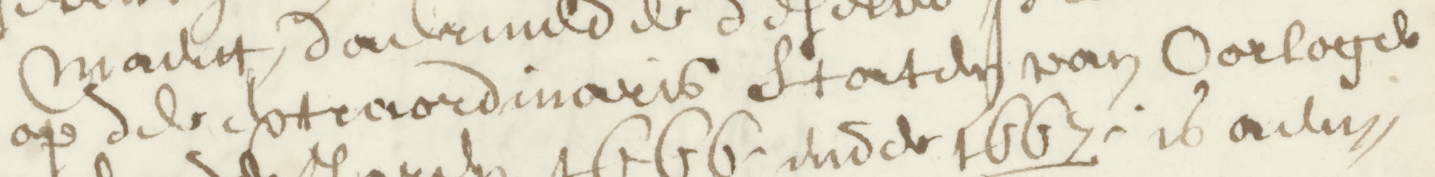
op de Extraordinaris Staten van Oorloge
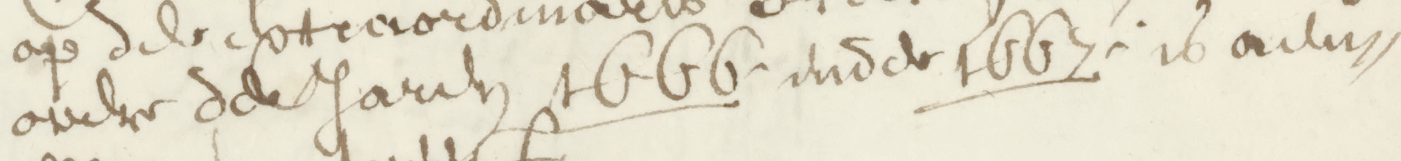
over de Jaren 1666 .ende 1667. is aen„
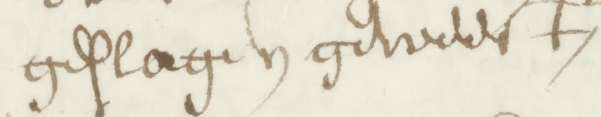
geslagen geweest.
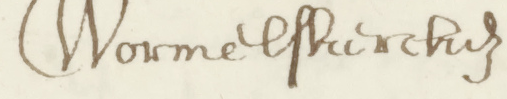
Wormelskercken
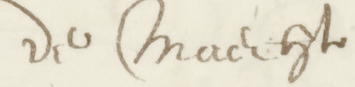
de Maecht
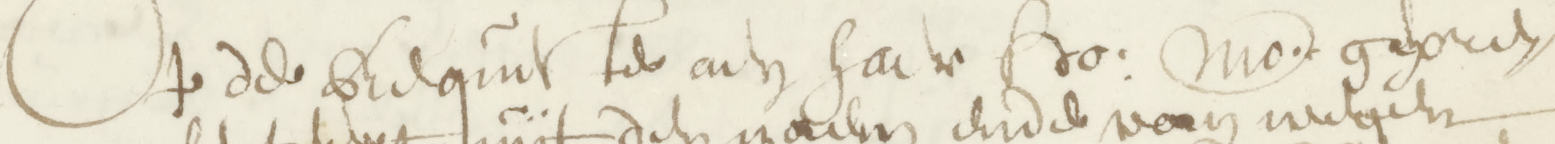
Op de Requeste aen haer Ho:Mo: gepre„
